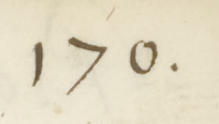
170.
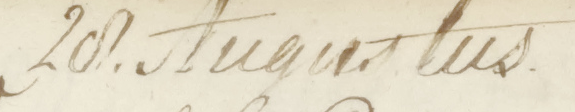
28. Augustus.
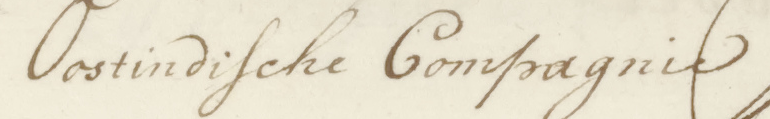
Oostindische Compagnie
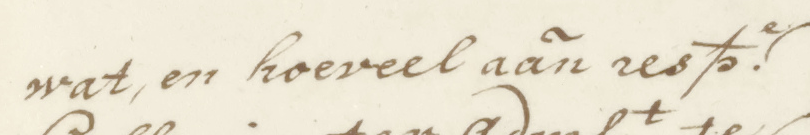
wat, en hoeveel aan respe.
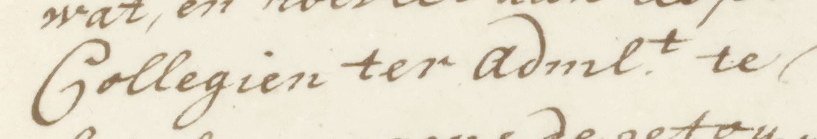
Collegien ter admlt te
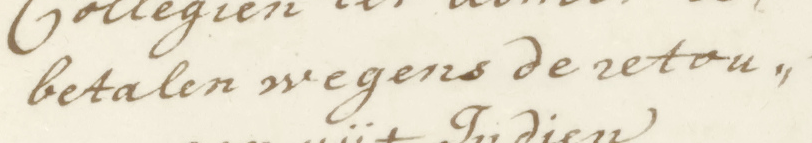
betalen wegens de retou„
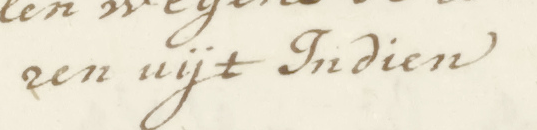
ren uyt Indien
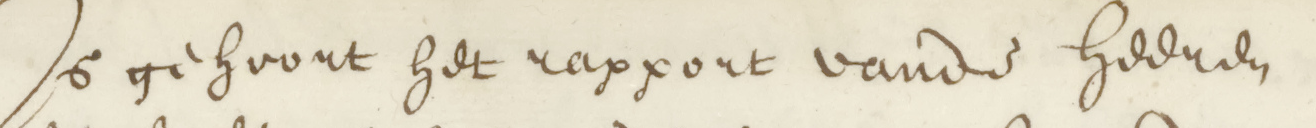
Is gehoort het rapport vande heeren
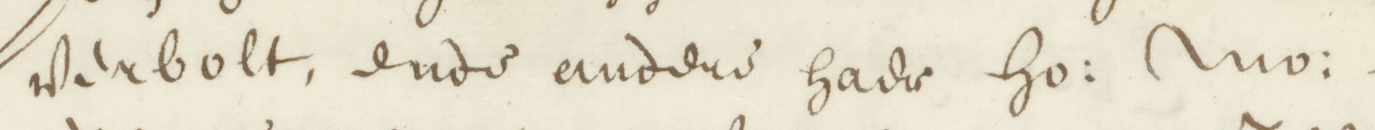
Verbolt, ende andere haer ho:Mo:
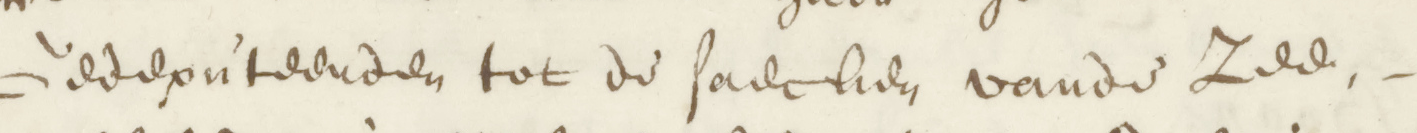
Gedeputeerden tot de saecken vande Zee,
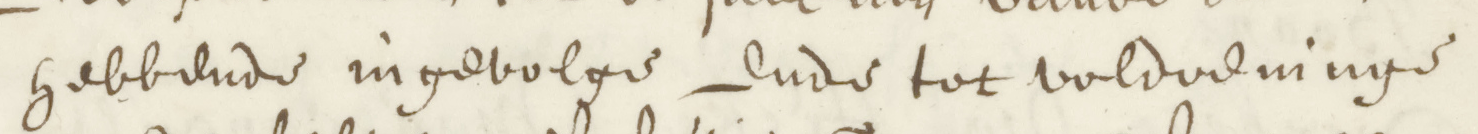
hebbende ingevolge ende tot voldoeninge
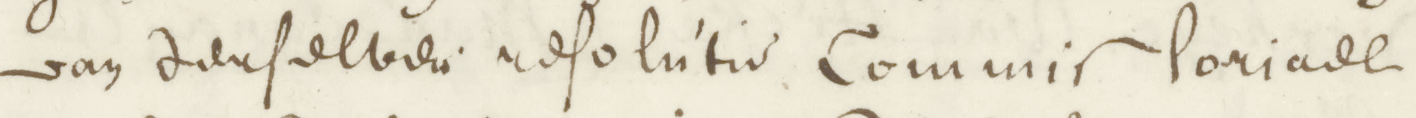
van derselver resolutie Commissoriael
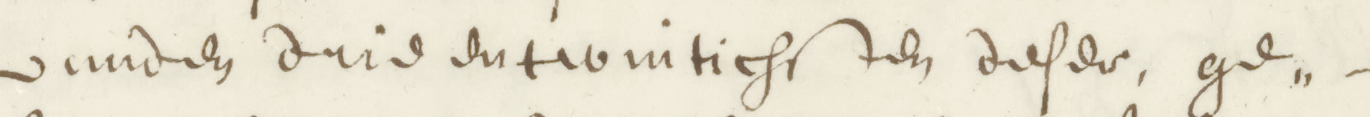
vanden drieentwintichsten deser, ge,,
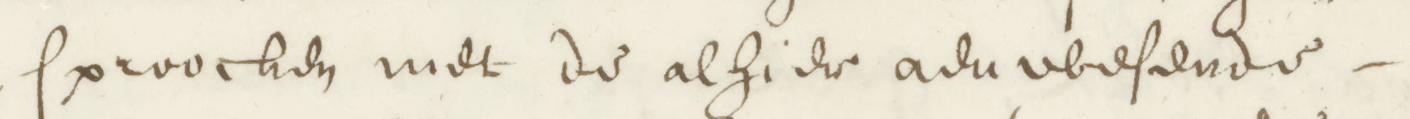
sproocken met de alhier aenwesende -
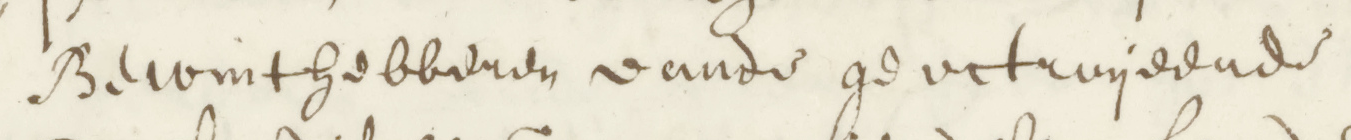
Bewinthebberen vande geoctroijeerde
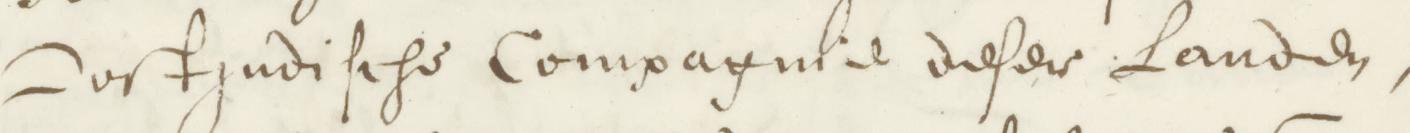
Oostindische Compagnie deser Landen
